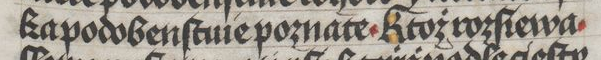ka podobenſtuíe poznate.Ktoż rozſiewa.
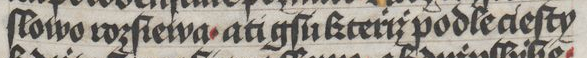lowo rozſiewa.a ti gſu kteṙiż podlé cieſty
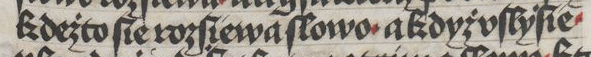kdeżto ſie rozſíewa ſlowo.a kdyż vſlyẛíe.
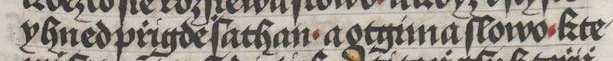Yhned pṙigde ẛathan.a otgima a ſlowo.kte¬
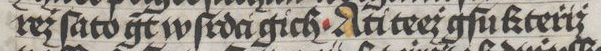reż ſato ḡt w ſrdci gich. A ti teež gſu kteṙíż
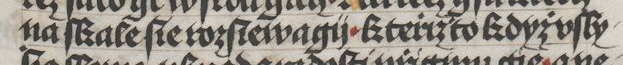na ſkale ſie rozſiewagi.kteṙíżto kdyż vſly¬
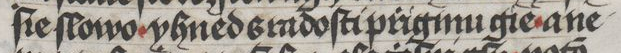ẛie ſlowo.yhned sradoſtí pṙigmu gíe.a ne¬
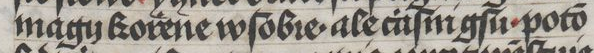magi koṙené w ſobie. ale ċaſní gſu.potō
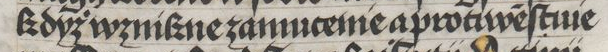kdyż wznikne zanuceníe a protiwēſtwie
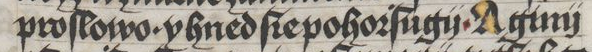pro ſlowo.y hned ſie pohorẛugij. A ginij
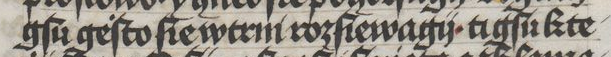gſu geẛto ſie wtrni rozſiewagij.ti gſu kte¬
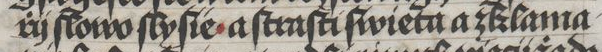ṙij ſlowo ſlyẛíe.a ſtraſti ſwieta a zklama¬
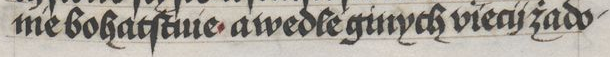níe bohatſtuíe.a wedlé ginych viecij żado¬
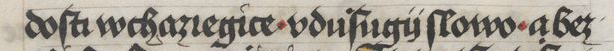doſti wchaziegice.vduẛugij ſlowo.a bez
